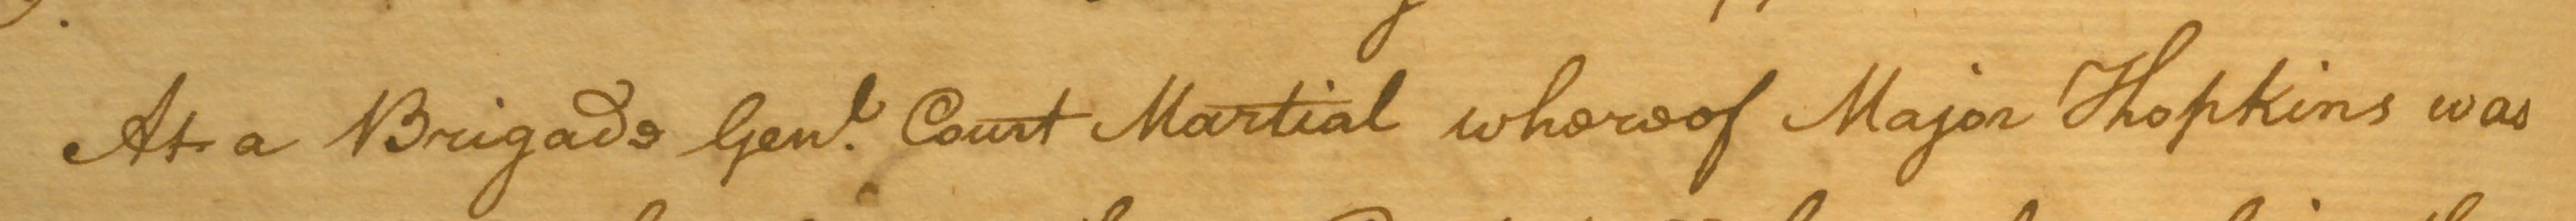At a Brigade Gen^l. Court Martial whereof Major Hopkins was
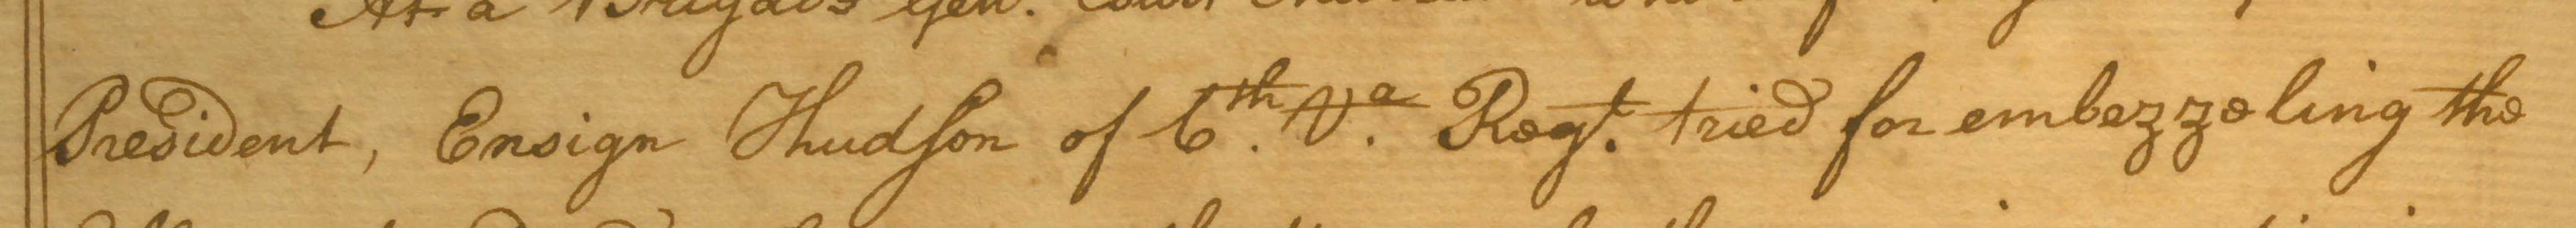President, Ensign Hudson of 6^th. V^a. Reg^t. tried for embezzeling the
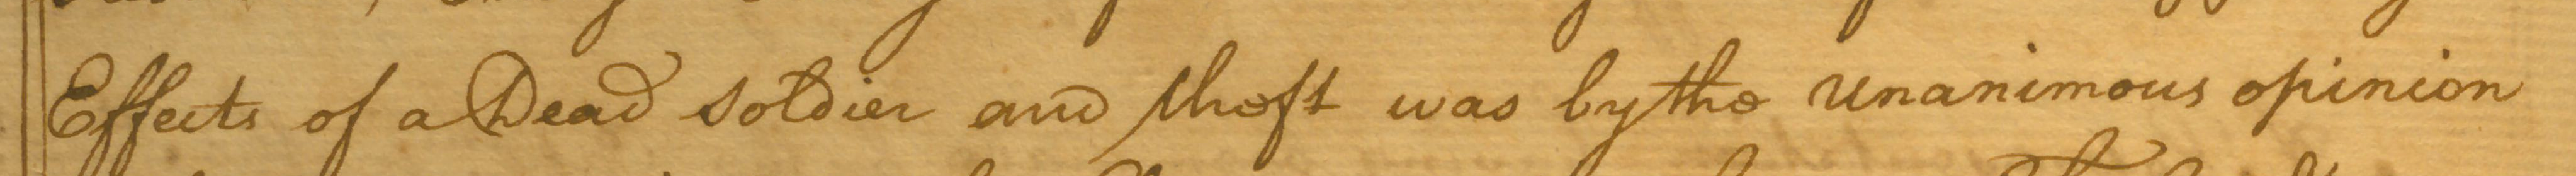Effects of a Dead soldier and theft was by the unanimous opinion
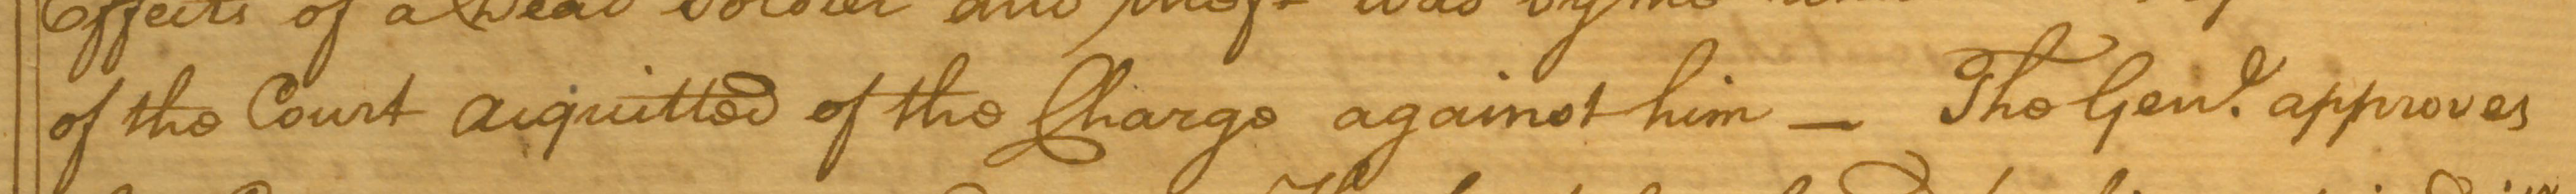of the Court acquitted of the Charge against him- The Gen^l. approves
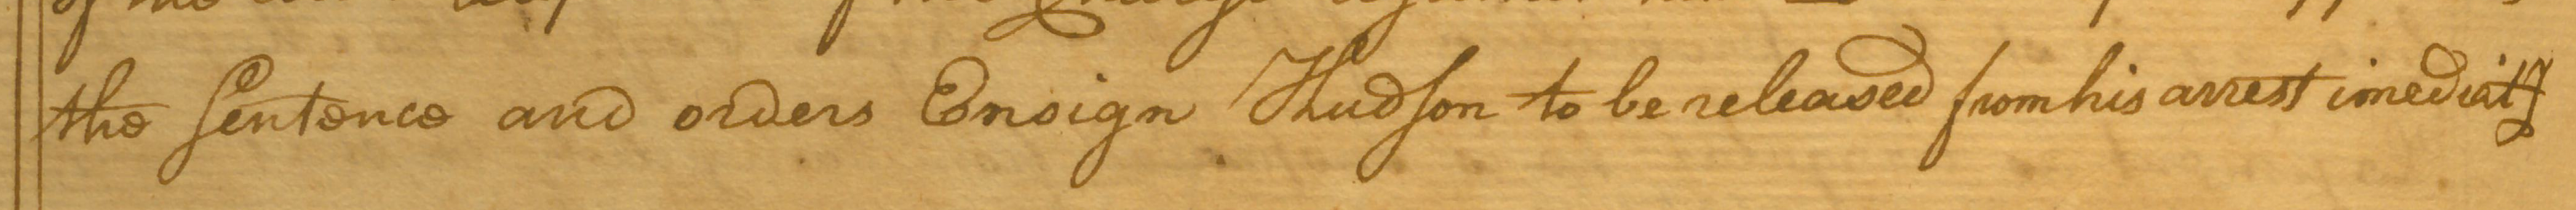the sentence and orders Ensign Hudson to be released from his arrest immdiat^y
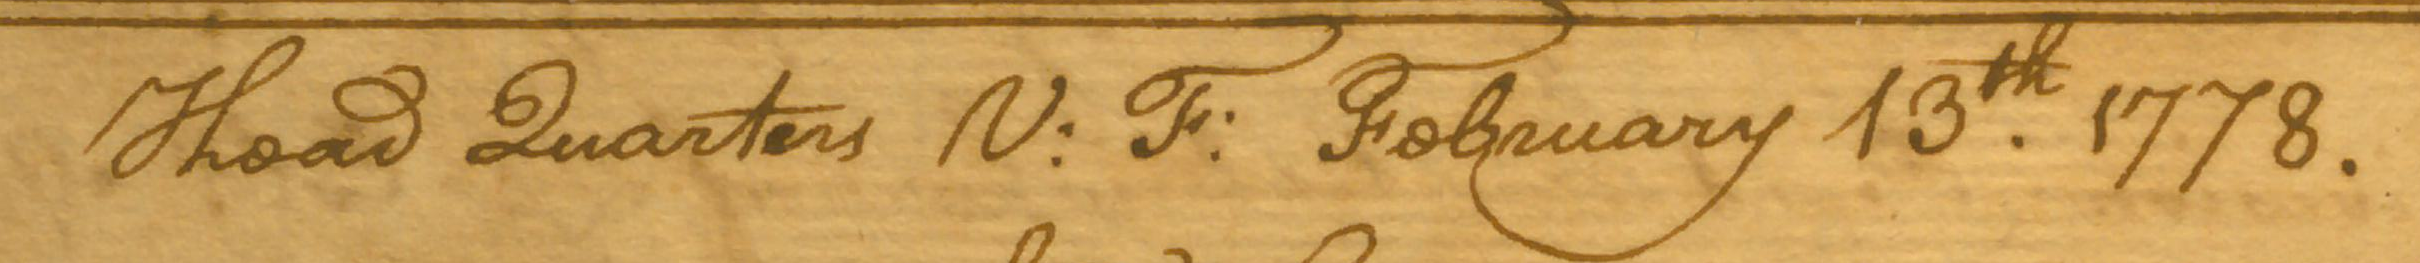Head Quarters V: F: February 13^th. 1778.
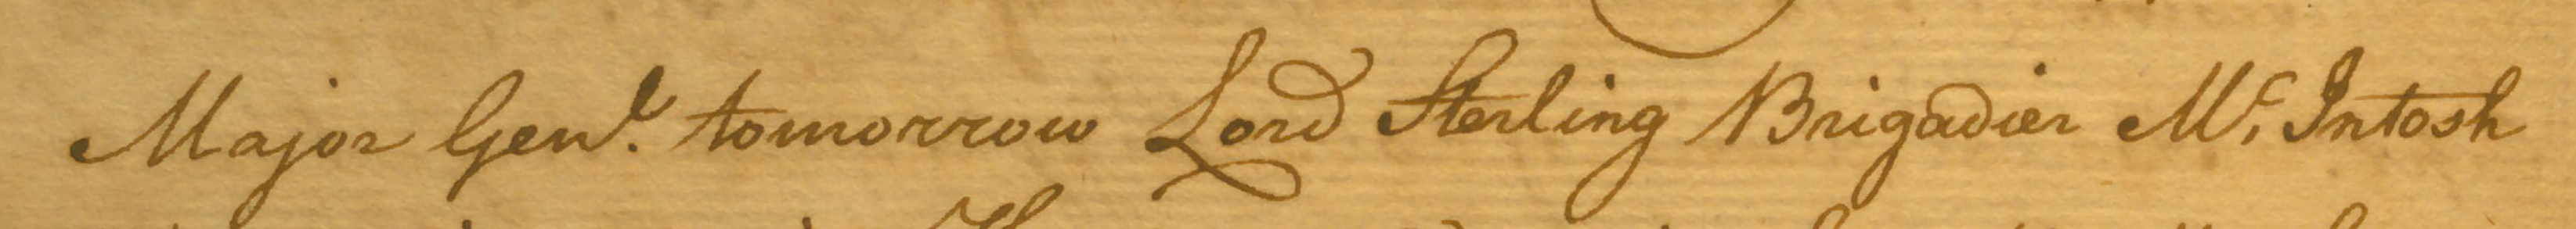Major Gen^l. tomorrow Lord Sterling Brigadier M^c.Intosh
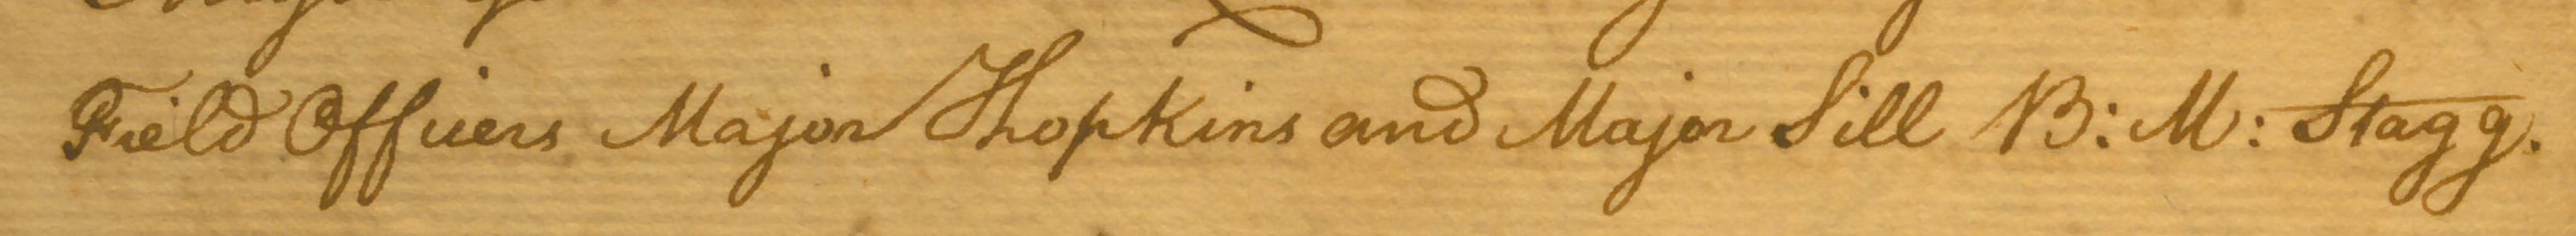Field Officers Major Hopkins and major Sill B: M: Stagg.
